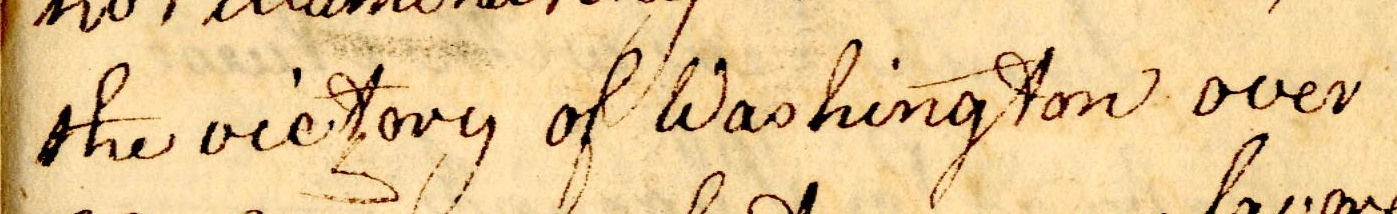the victory of Washington over
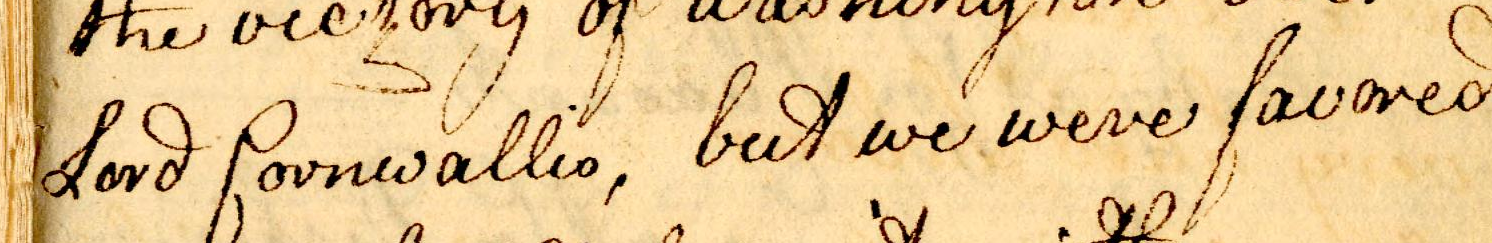Lord Cornwallis, but we were favored
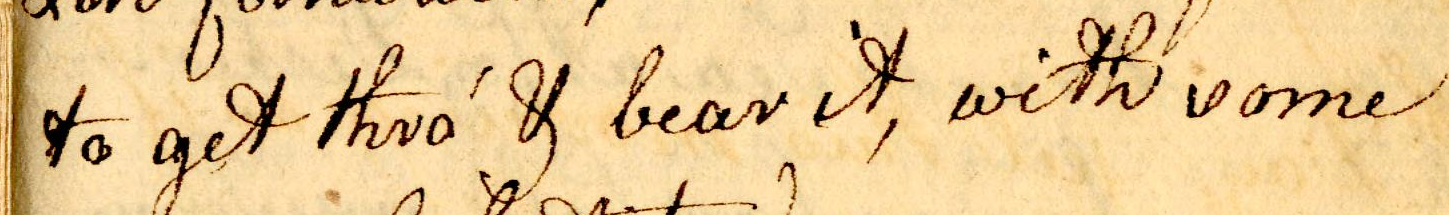to get thro' & bear it, with some
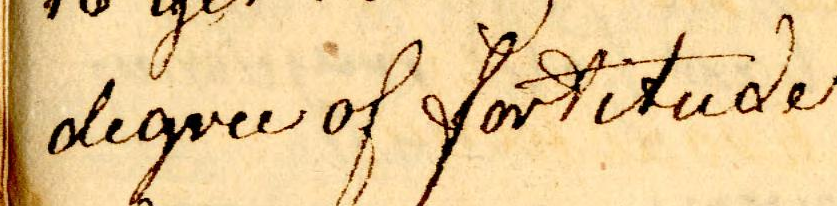degree of fortitude
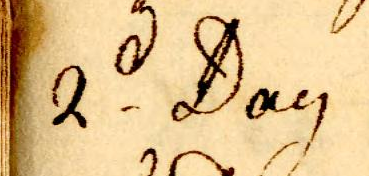2^d- Day
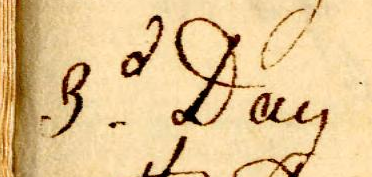3^d. Day
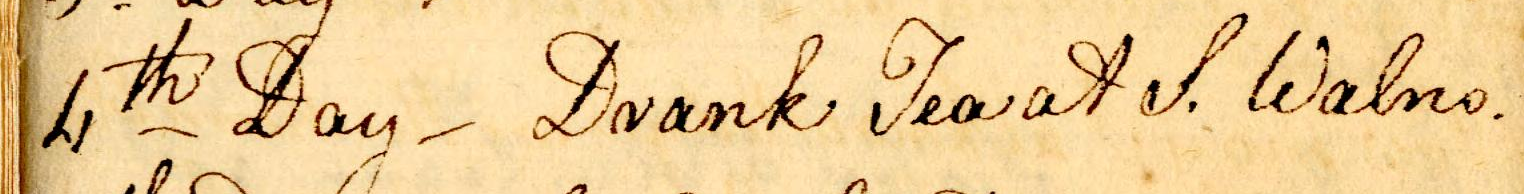4^th Day- Drank Tea at S. Walns
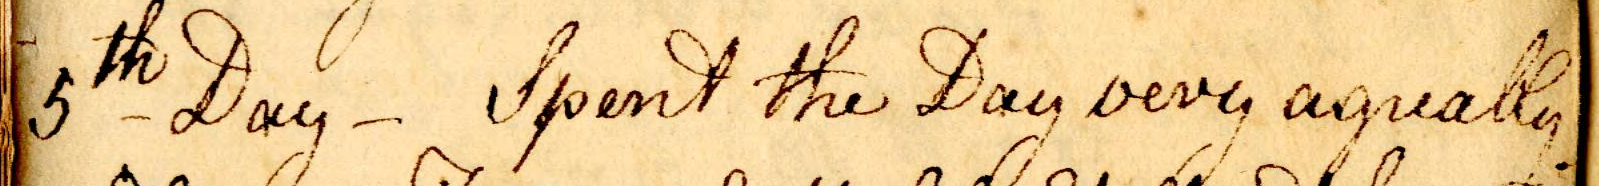5^th Day- Spent the Day very agreably
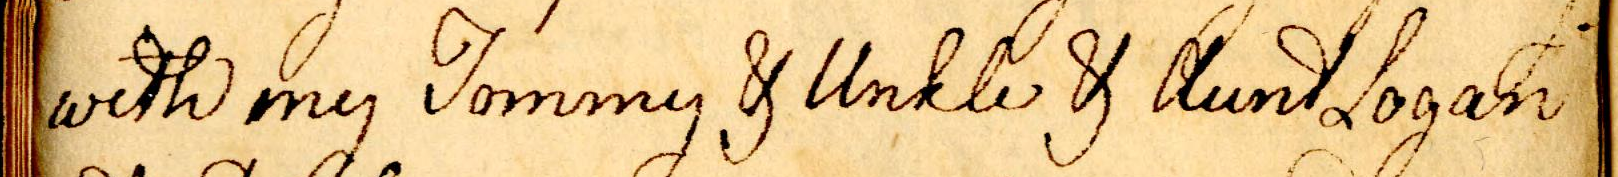with my Tommy & Unkle & Aunt Logan
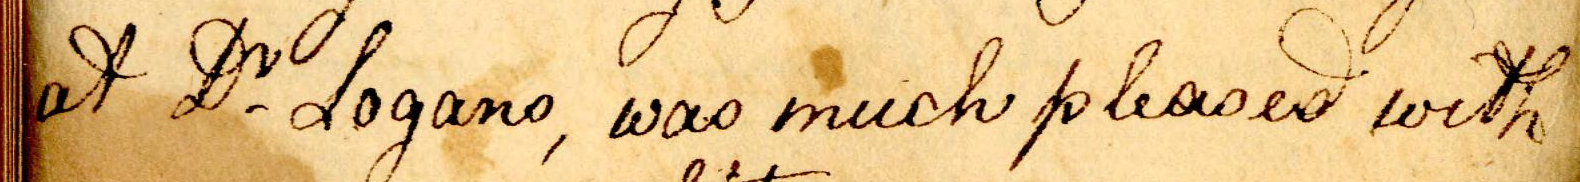at D^r. Logans, was much pleased with
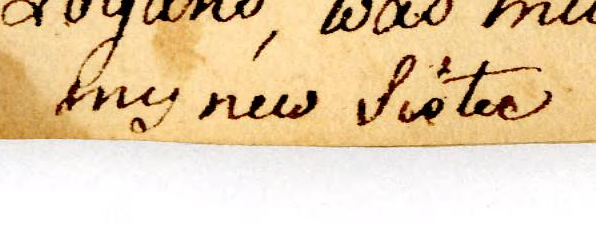my new Sister
